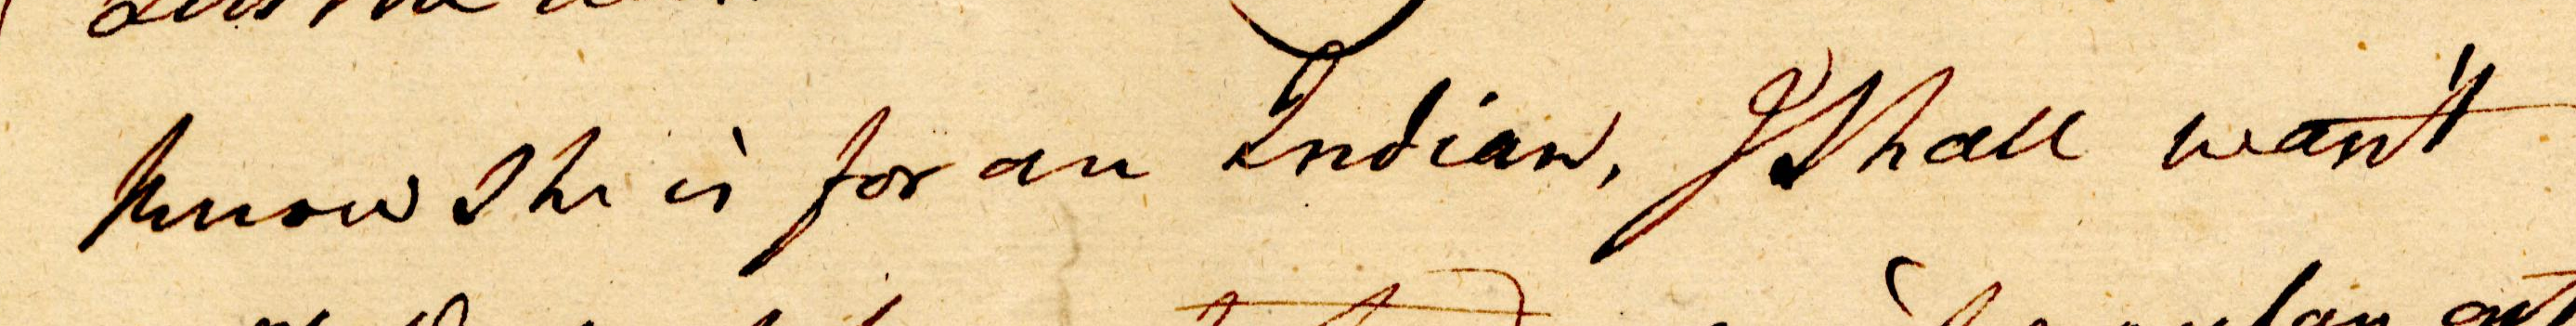know she is for an Indian, I shall want
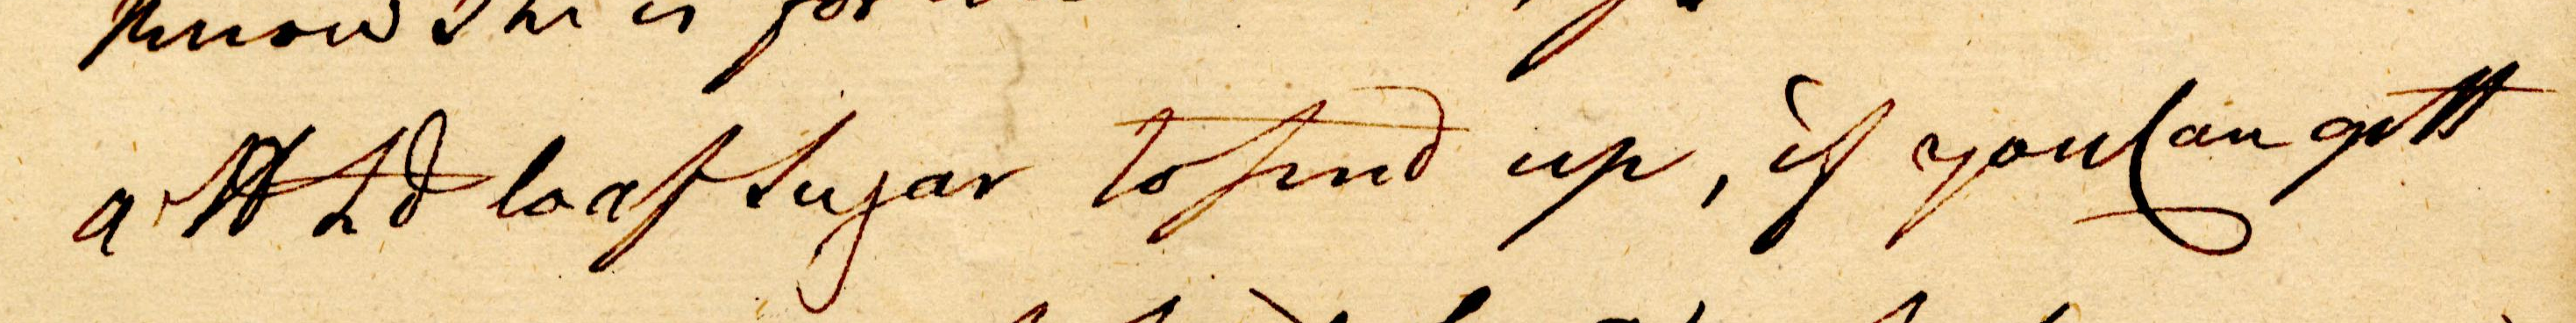a lb Ld loaf sugar to send up, if you can gett
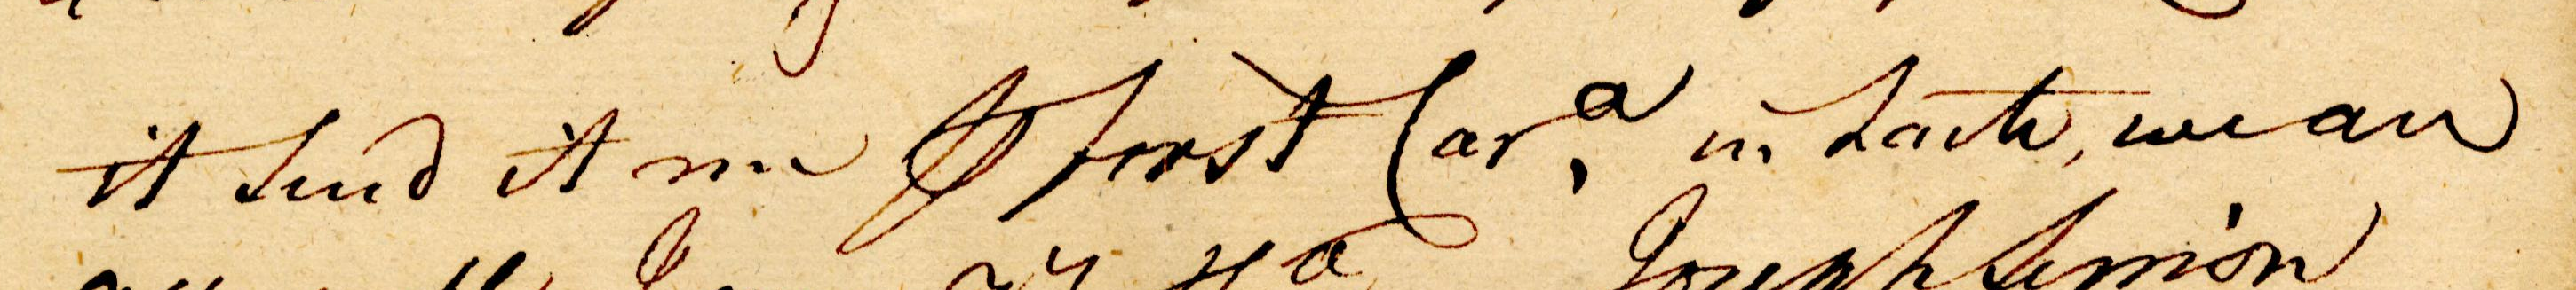it Send it me Per first Car^a. in haste, we are
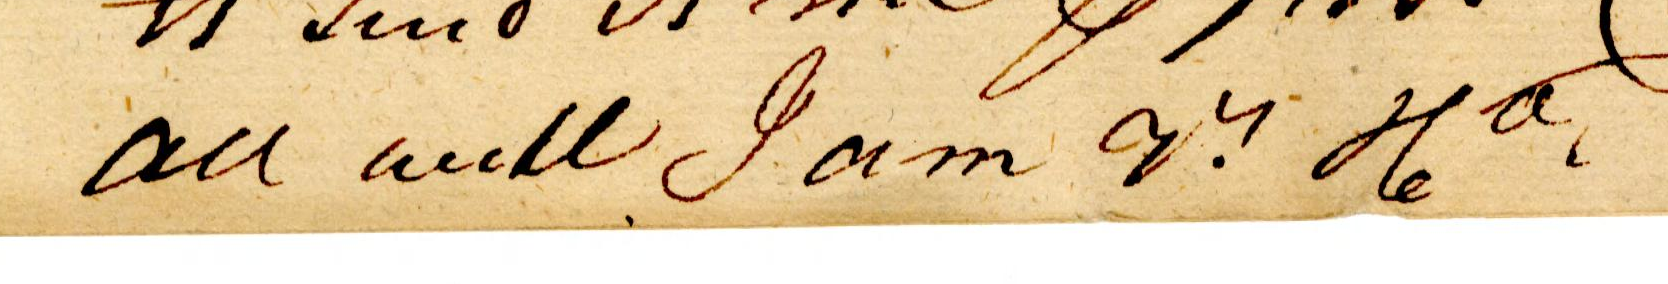all well I am y^r. H^e.
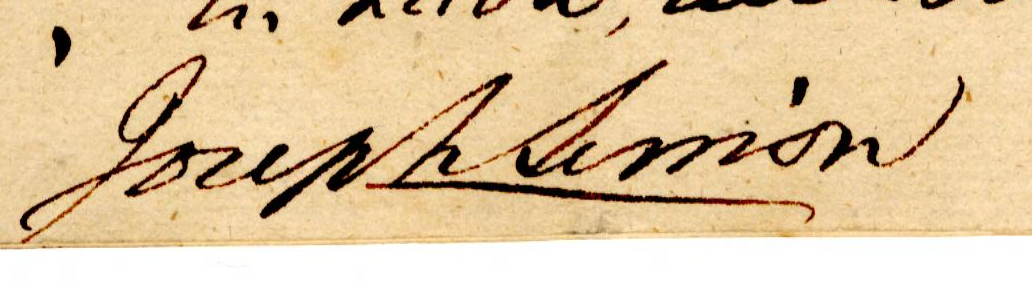Joseph Simon
